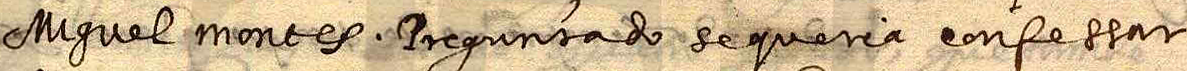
Miguel montes. Preguntado se queria confessar
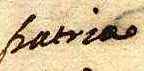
patria
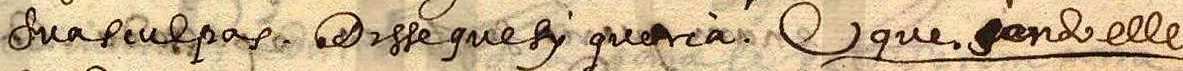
suas culpas. Disse que sy queria. E que sendo elle
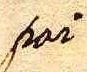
pai
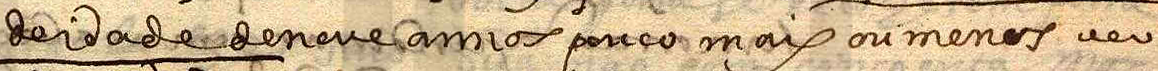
de idade de noue annos pouco mais ou menos ueo
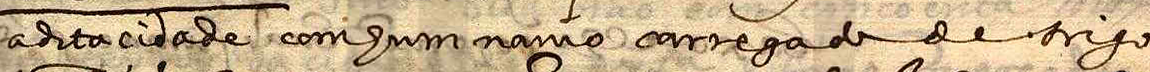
a dita cidade com hum nauio carregado de trigo
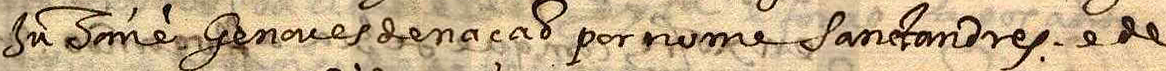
hū homē Genoues de naçaõ por nome Sanctandres e de
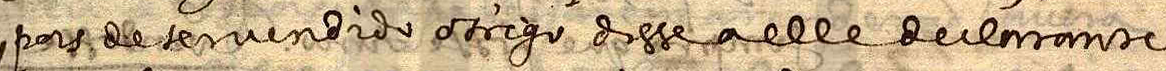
pois de ser uendido o trigo disse a elle declarante
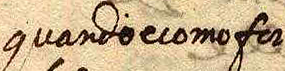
quando e como foi
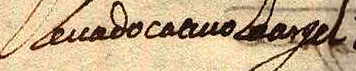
leuado catiuo a argel
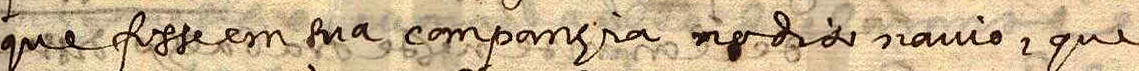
que fosse em sua companhia no dito nauio, que
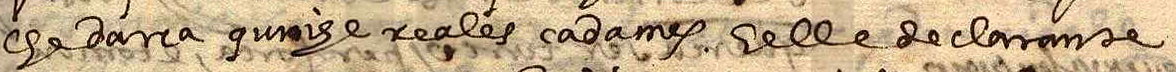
lhe daria quinze reales cada mes. E elle declarante
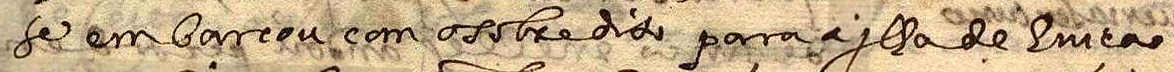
se embarcou com o sobredito para a jlha de Euiça
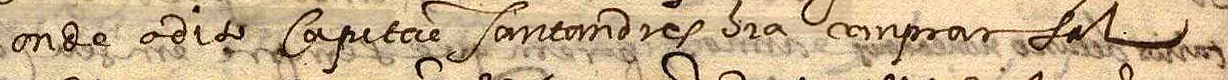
onde o dito Capitaõ Santandres hia comprar saL
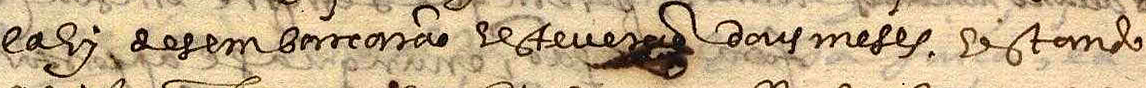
e ahj desembarcaraõ E esteueraõ dous meses. E estando
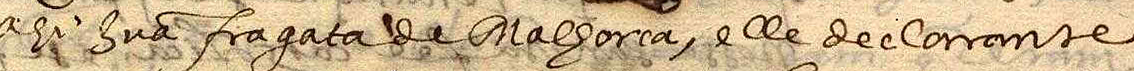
ahi huā fragata de Malhorca, elle declarante
